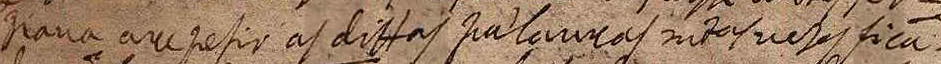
naua a repetir as dittas palauras mtas uezes ficā
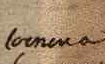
tornou a
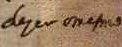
dizer o mesmo
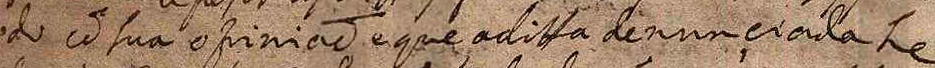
do cō hua opinião e que a ditta denunciada he
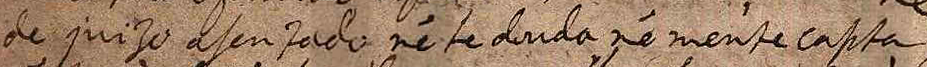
de juizo asentado nē he douda nē mentecapta
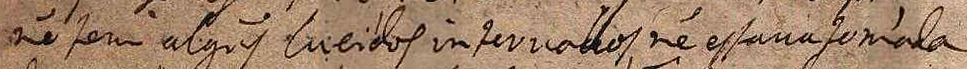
nē tem algūs lucidos interuallos, nē estaua tomada
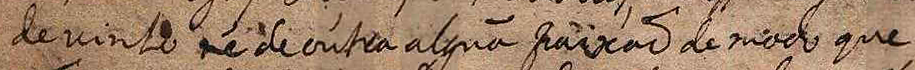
de uinho nē de outra alguã paixaõ de modo que
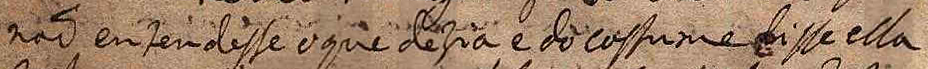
naõ entendesse o que dezia, e do costume disse ella
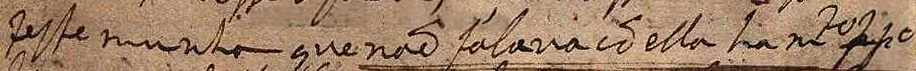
testemunha que naõ falaua cō ella ha mto tnpo
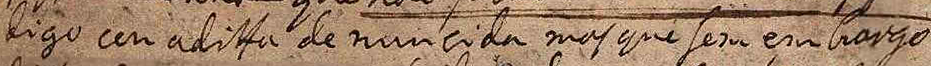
digo con a ditta denuncida mas que sem embargo
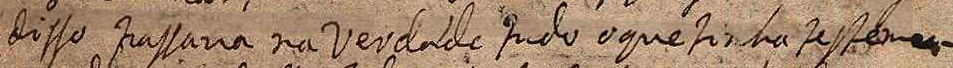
disso passaua na verdade tudo o que tinha testemu
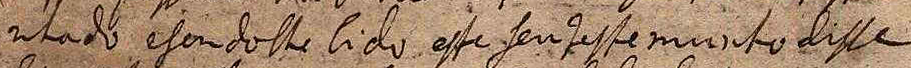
nhado e sendolhe lido este seu testemunho disse
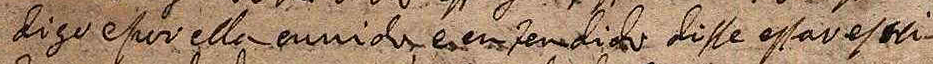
digo e por ella ouvido, e entendido disse estar escri
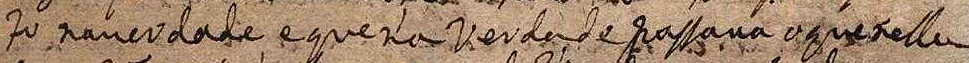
to na uerdade e que na verdade passaua o que nella
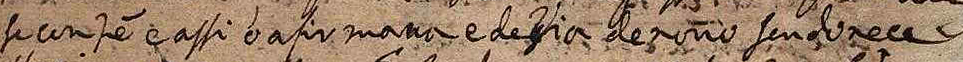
se contē e assi o afirmaua e dezia de nouo sendo nece
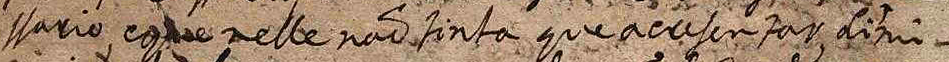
ssario, e que nelle naõ tinha que acresentar, dimi
